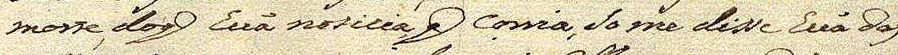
morte do q̄ huā noticia, q̄ corria, so me disse huā das
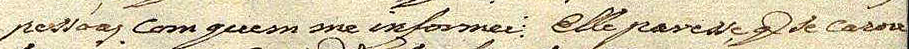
pessoas com quem me informei: Elle paresse q̄ se cazou
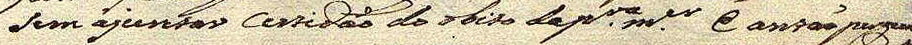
sem ajuntar certidaõ do obito da p.ra m.er E antaõ pergun
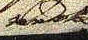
tado se
